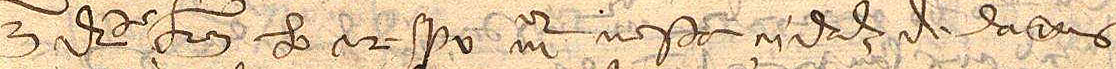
item drte fr̄z ho crespo mor nesta cidade de lagos
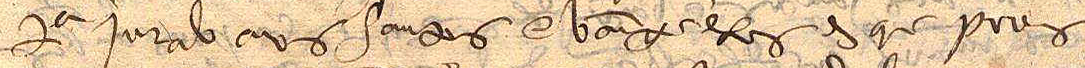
ta Jurado aos Santos evāgelhos en qe poos
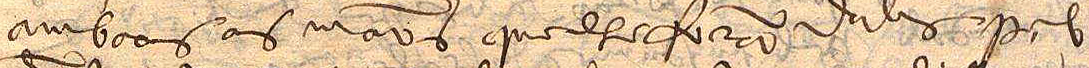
ambaas as mãos que lhe forão dados pelo
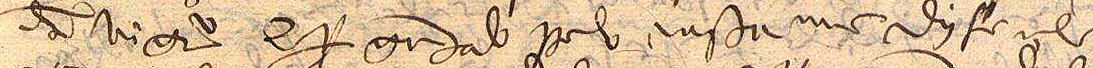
d̄to vigro e ꝑgūtado pelo custume dyse ele
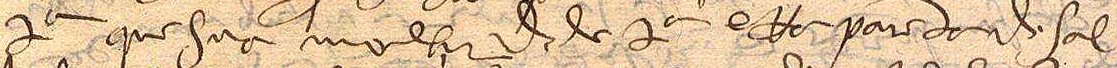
ta que Sua molher dele ta eRa par̄eta de Sal
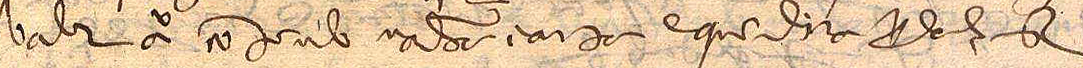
vador ao cōteudo na d̄ta carta e que dira ꝟdade
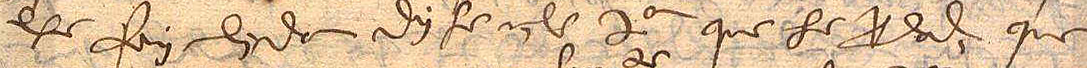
lhe foy lida dyse ele ta que he ꝟdade que
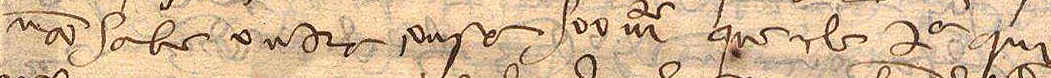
não Sabe outra cousa soomte que ele ta quo
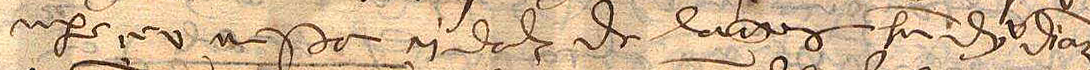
nheçeo nesta çidade de lagos hū dyo d̄iaz
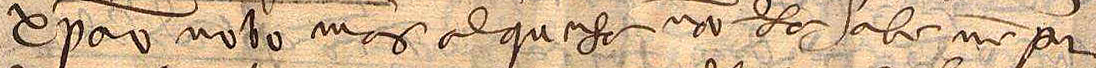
xpão novo mas alqunha não lha Sabe nē por
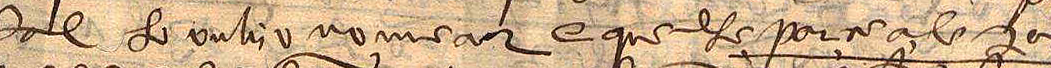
tal ho ouvio nomear e que lhe parçe a ele ta
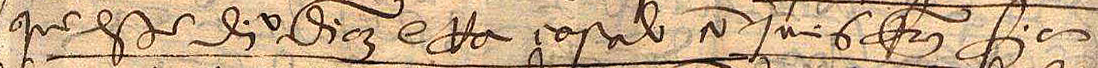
que este dyo d̄iaz eRa casado c̄o Jnes f̄rz fja
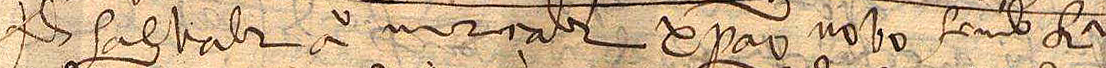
de Salvador ao mercador xpão novo sendo frco
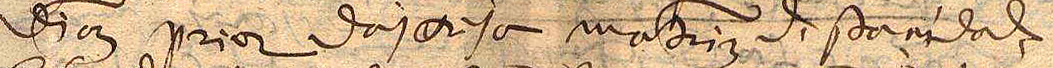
dīaz prior da jgreJa mat̄riz desta çidade
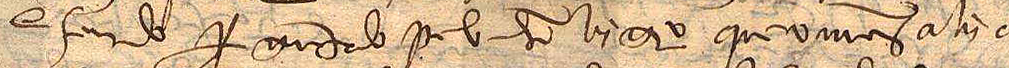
e Sendo ꝑgūtado pelo d̄to vigro que om̄es avia
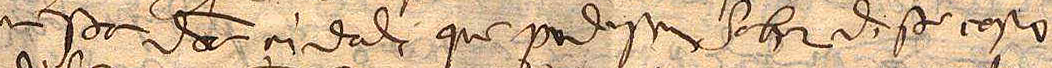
nesta dt̄a çidade que podesem Saber deste caso
